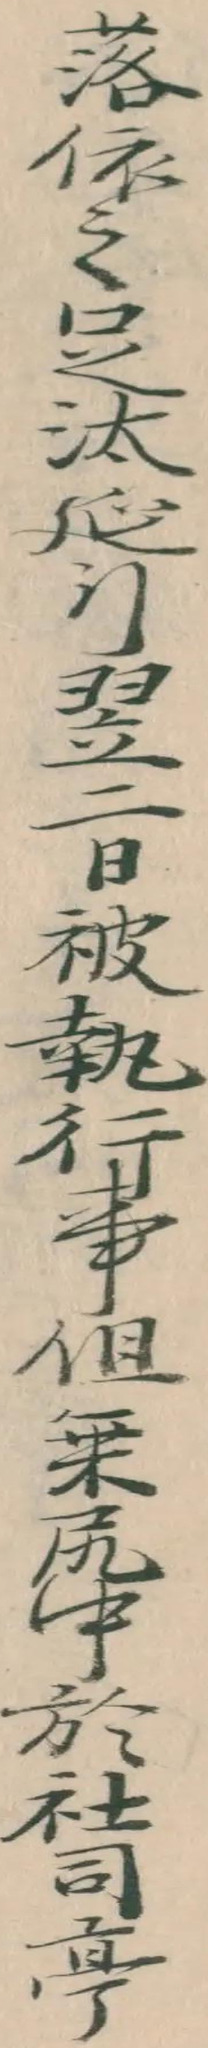落依之足汰延引翌二日被執行事但乗尻中於社司亭
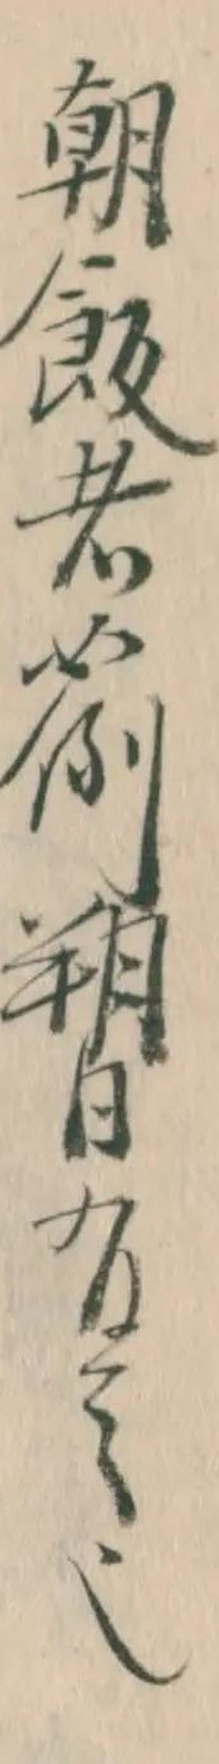朝飯者如例朔日有之也
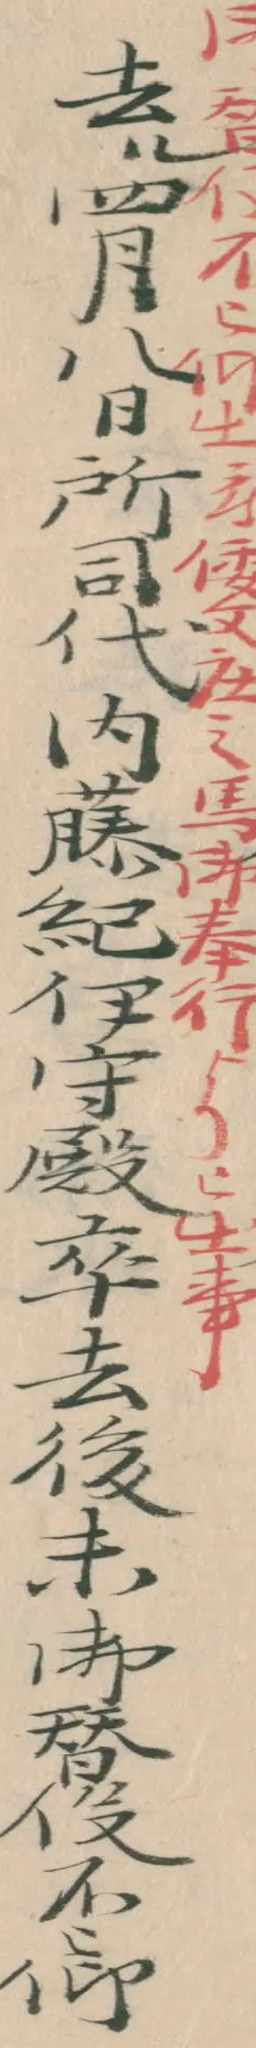一去ル四月八日所司代内藤紀伊守殿卒去後未御替役不被仰
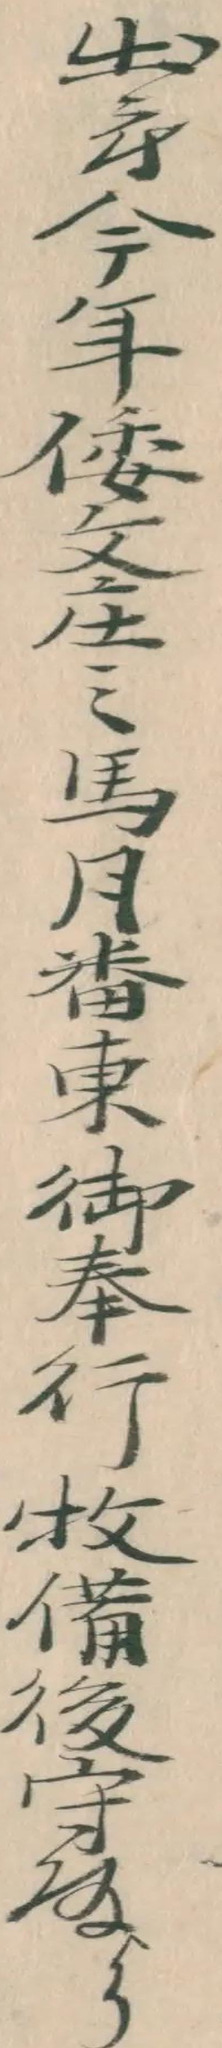出ニ付今年倭文庄之馬月番東御奉行牧備後守殿より
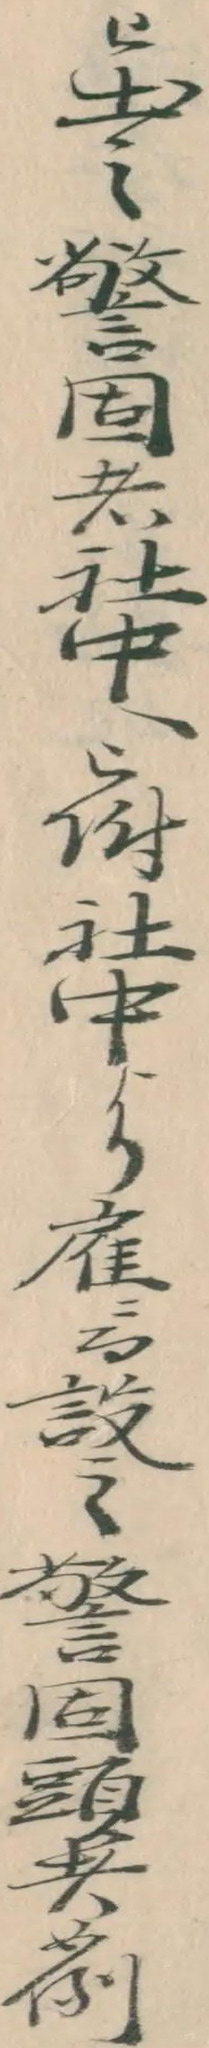被出之警固者社中へ被附社中より雇ニ而設之警固頭共如例
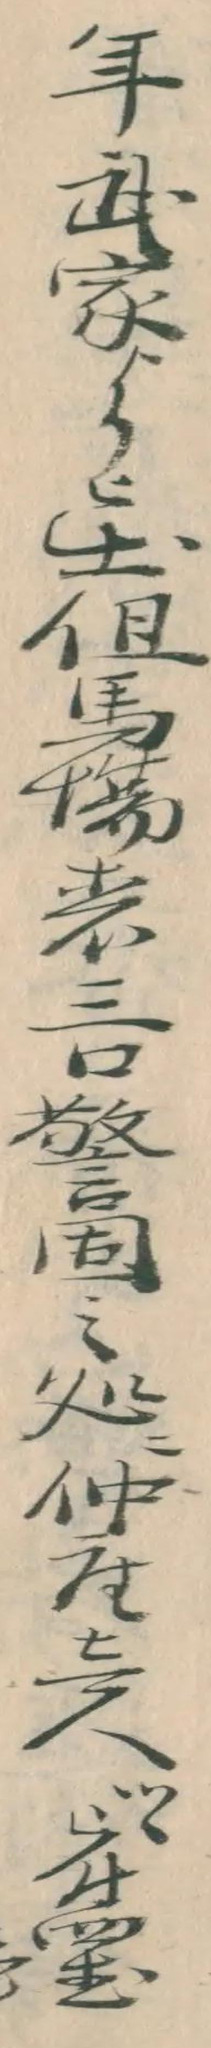年武家より被出但馬場表三口警固之処ニ仲座壱人ツヽ被付置事

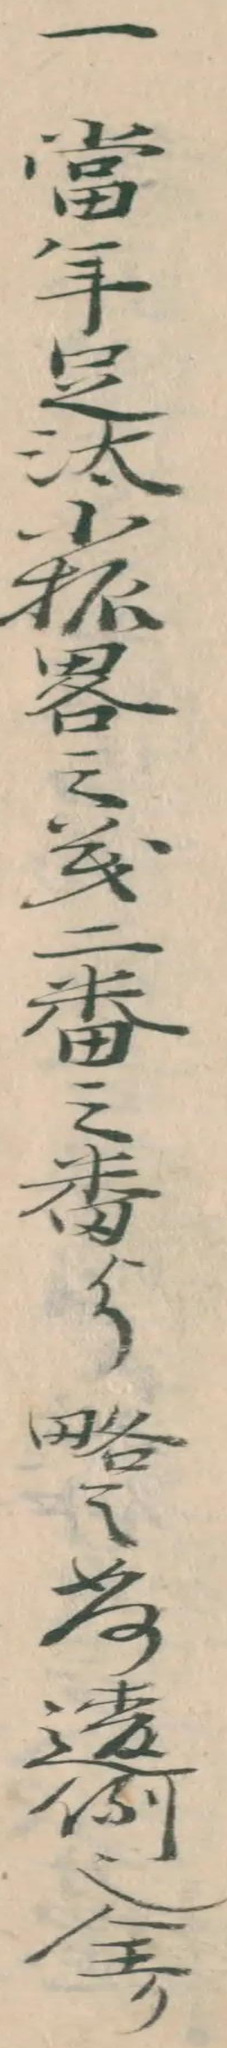一当年足汰小振略之義二番之番より略之如何違例也全ク
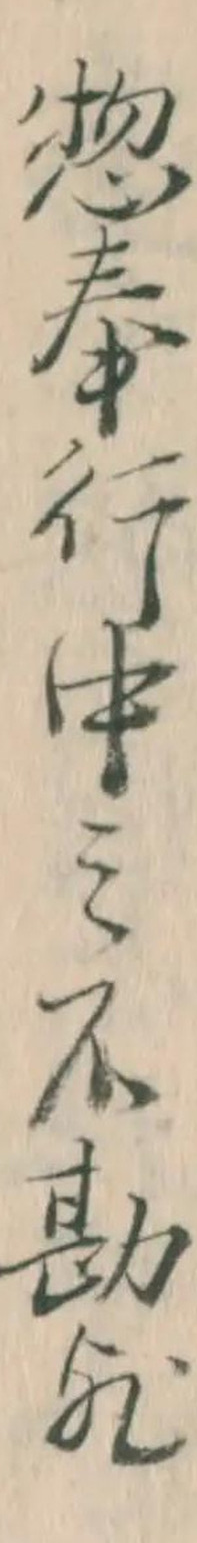惣奉行中之不勘歟
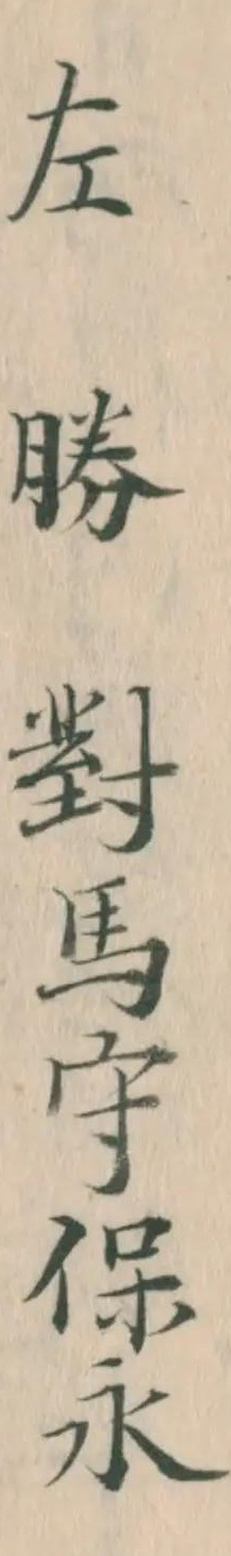左勝対馬守保永
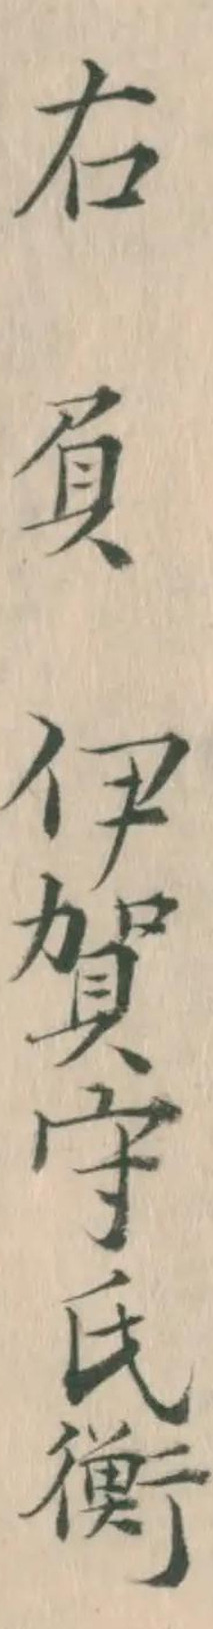右負伊賀守氏衡
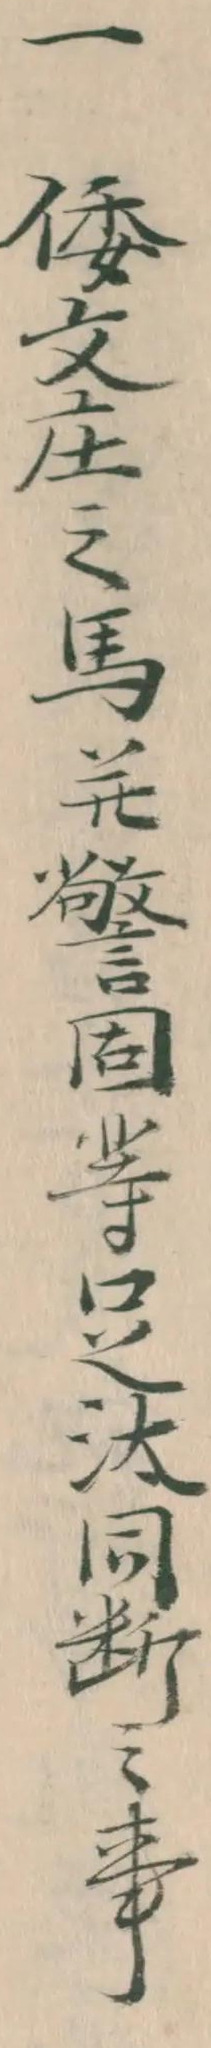一倭文庄之馬并警固等足汰同断之事
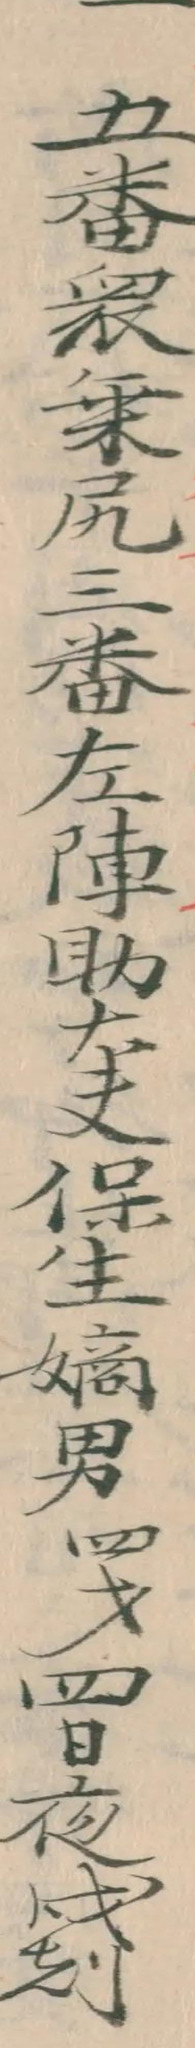一五番衆乗尻三番左陣助大夫保生嫡男四才四日夜戌刻
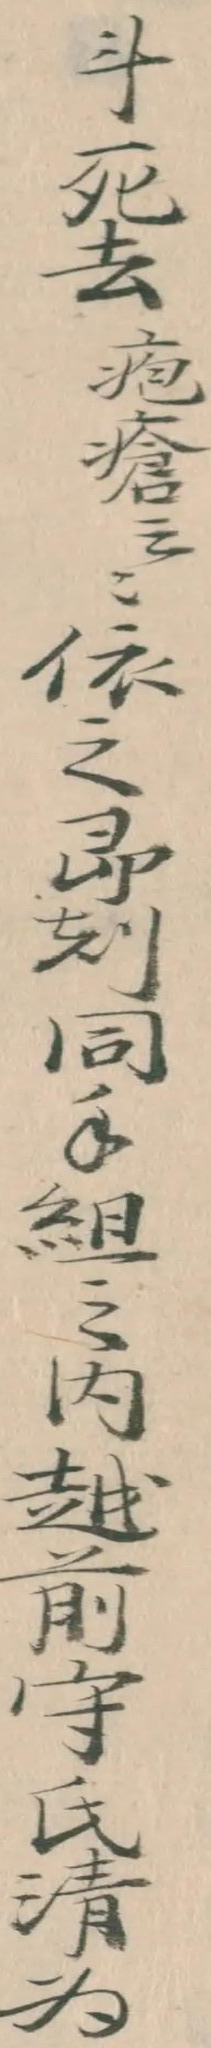計死去疱瘡云々依之即刻同手組之内越前守氏清為
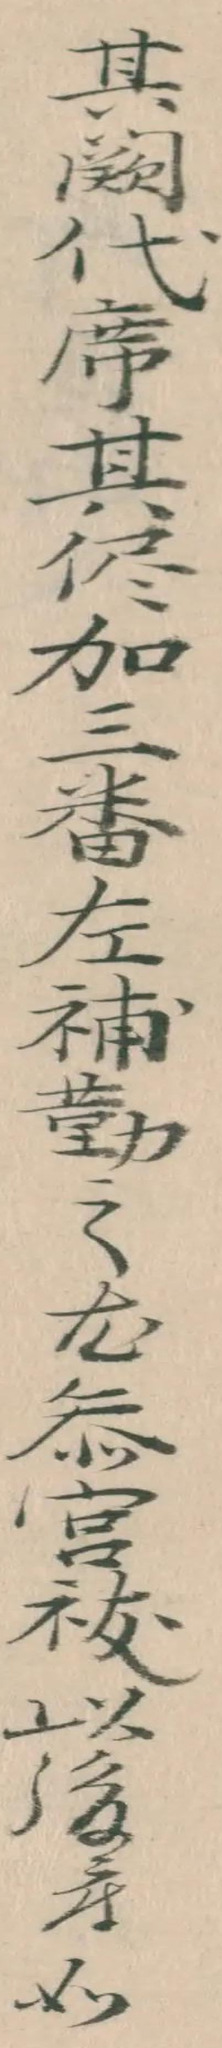其蕨代席其侭加三番左補勤之尤参宮祓以後ニ付如
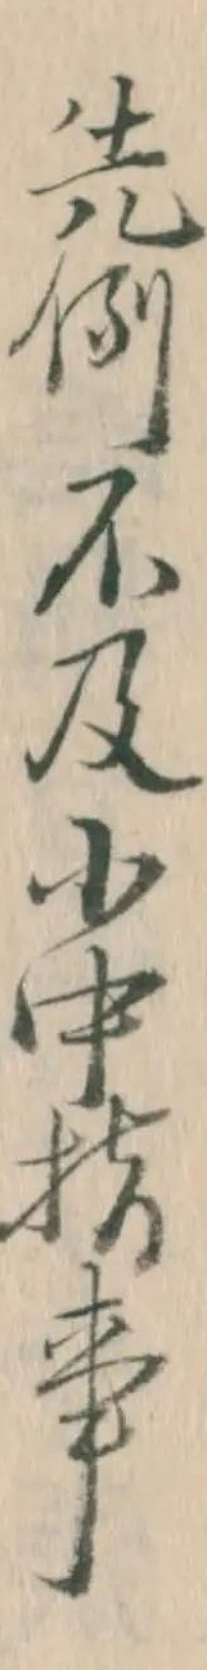先例不及小中指事
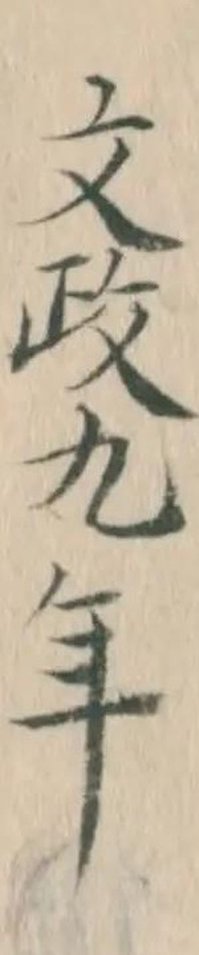文政九年
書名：賀茂社記録. 第10冊
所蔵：国立国会図書館 National Diet Library, JAPAN
